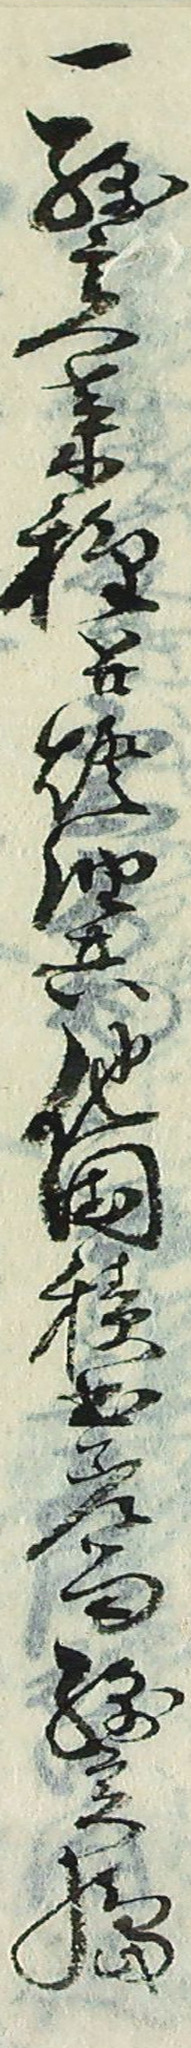一綿実菜種幷燈油共他国積出差留綿実搗
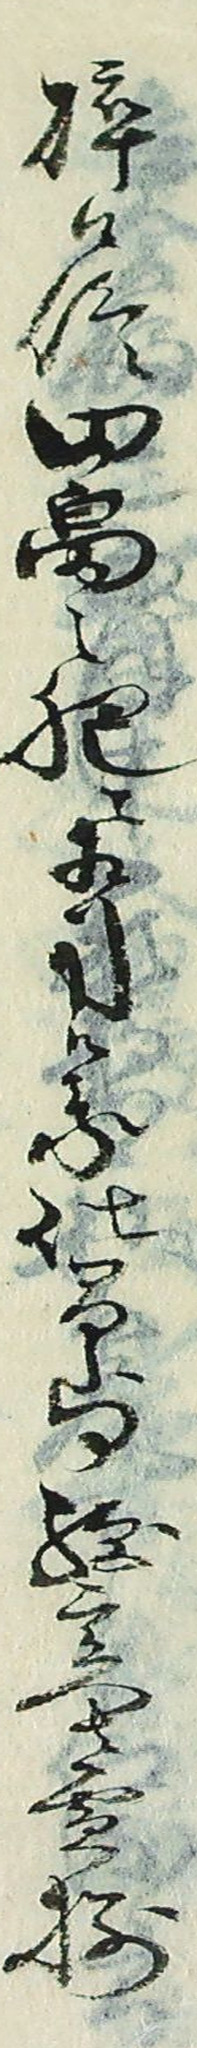碎候侭田畠之肥に相用候義仕間布綿実者売捌
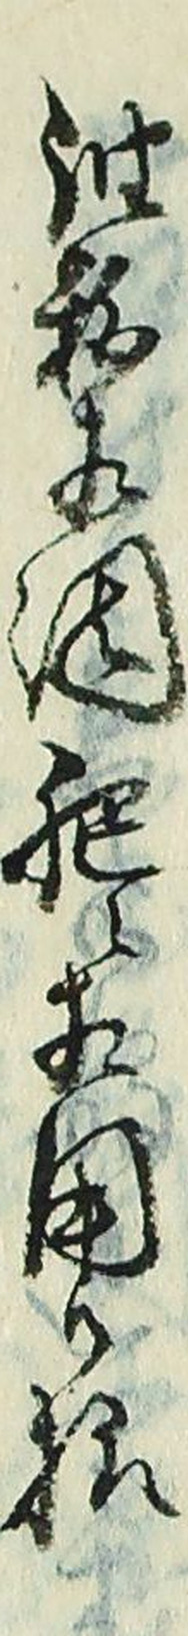油粕相調肥に相用候様
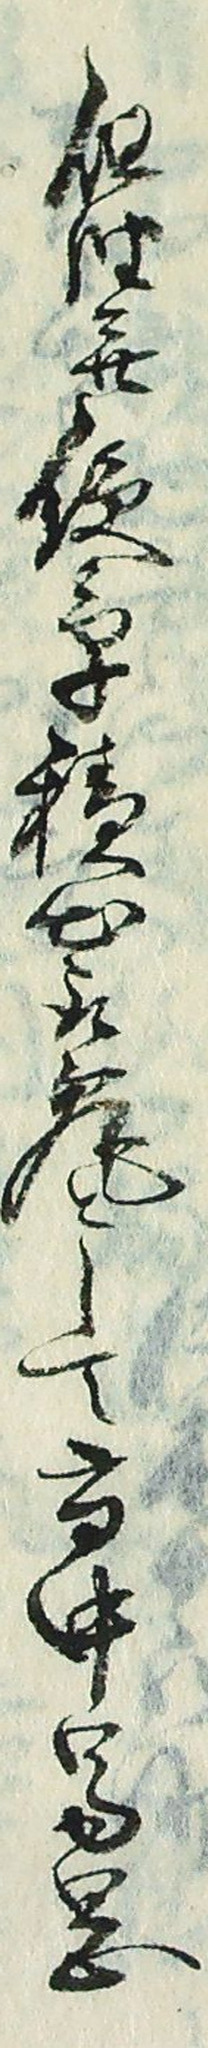但油幷絞草積出取究として市中富岡
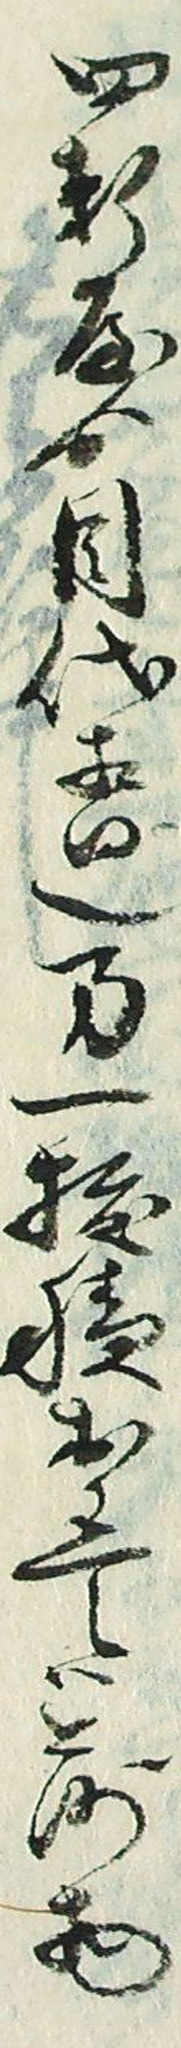四軒屋より目代相廻万一抜積於有之は荷物
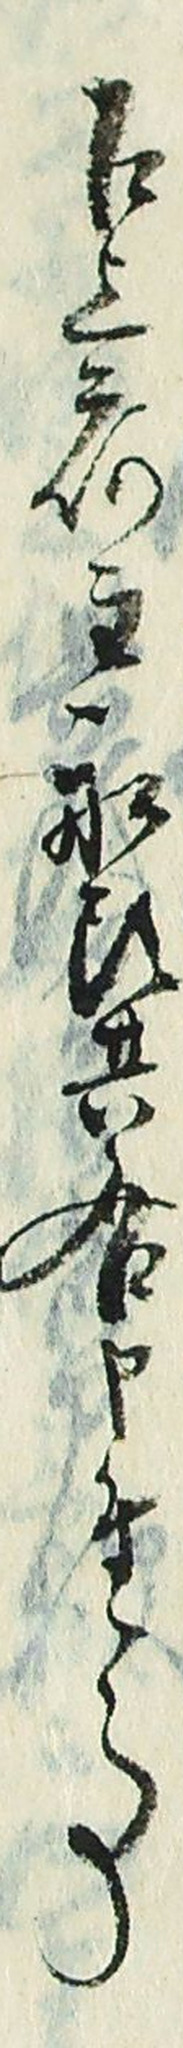召上荷主船頭共咎申付候事
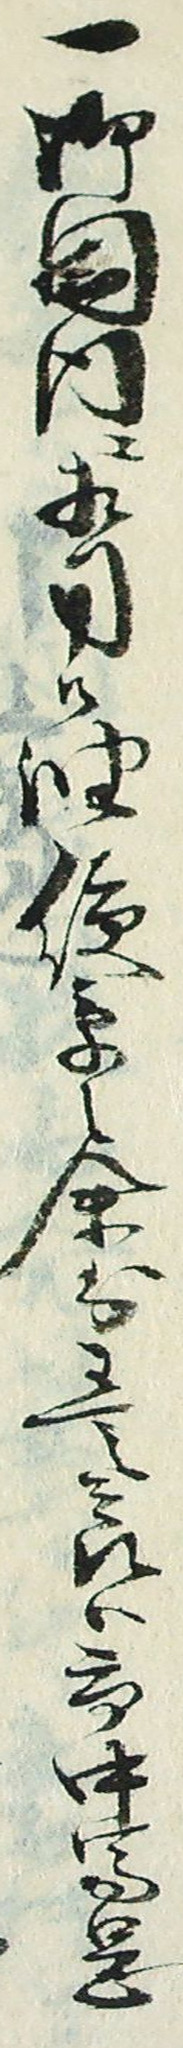一御国内に相用候油絞草之余分有之節は市中富岡
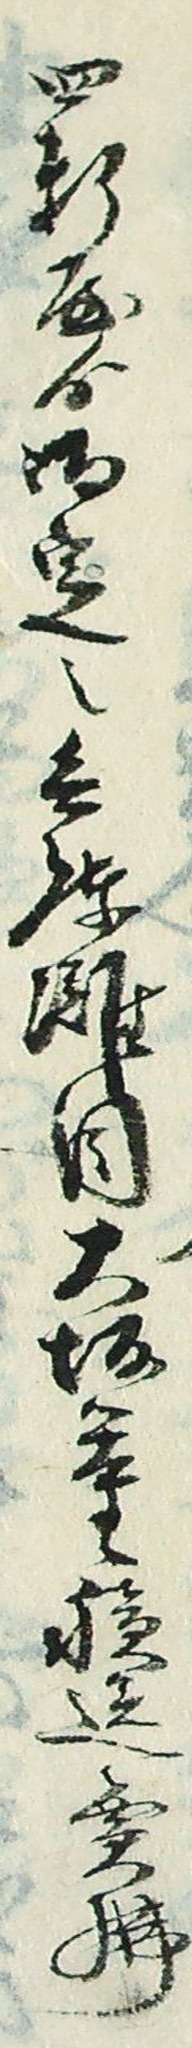四軒屋ゟ御定之兵庫灘目大坂等へ積送売払
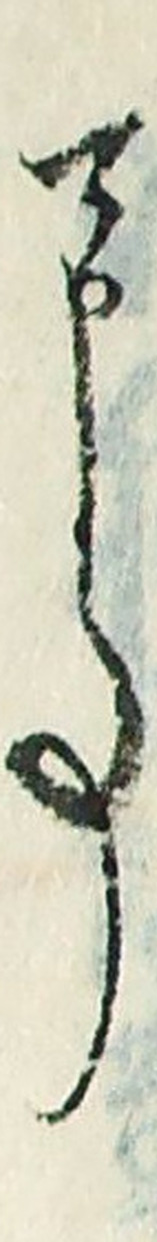可申事

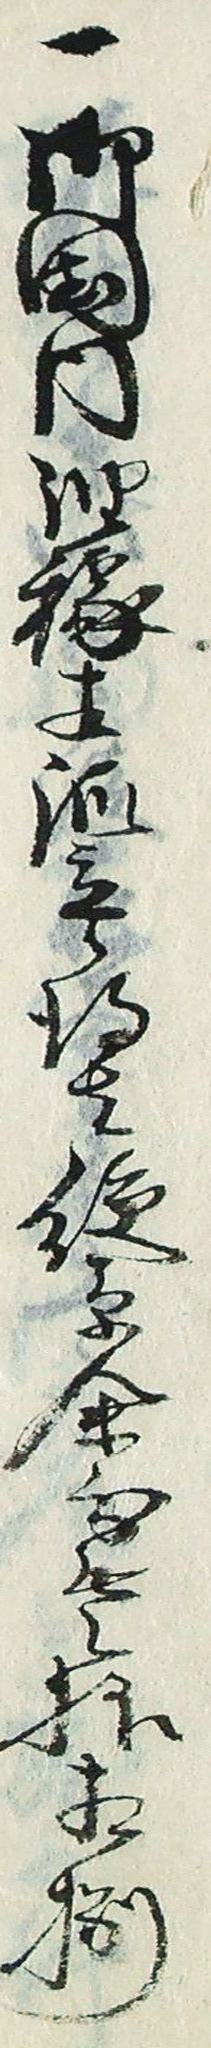一御国内油稼相派立候得者絞草余分無之様相捌
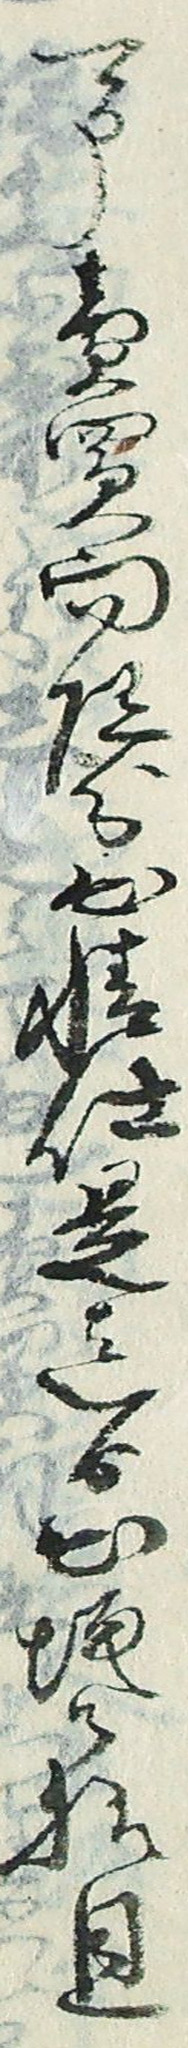可申売買向随分出情仕是迄ゟ出増候様且
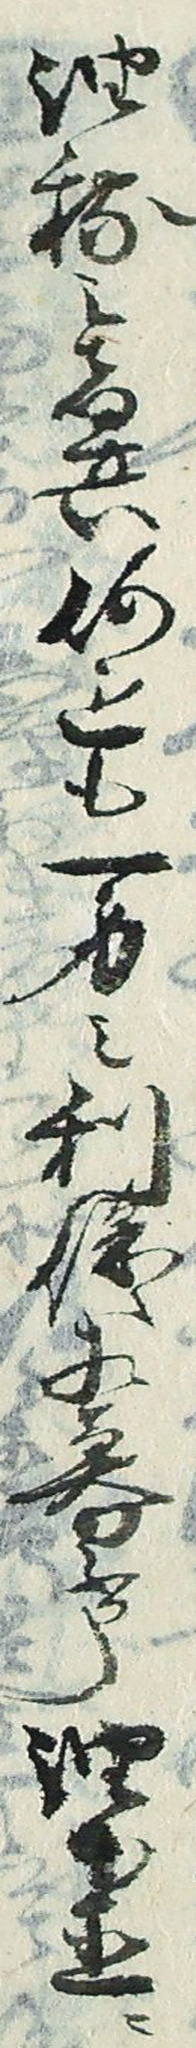油稼之者共何れも一身之利徳相募不申油下直に
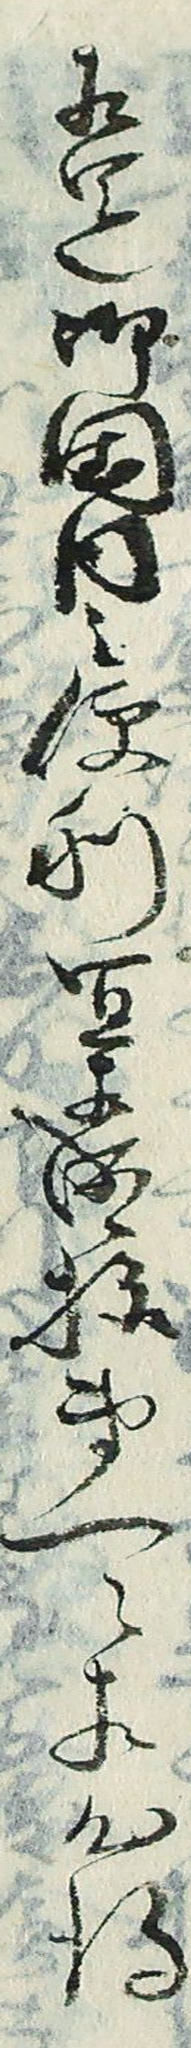相運御国内之便利宜相成候様第一に相心得
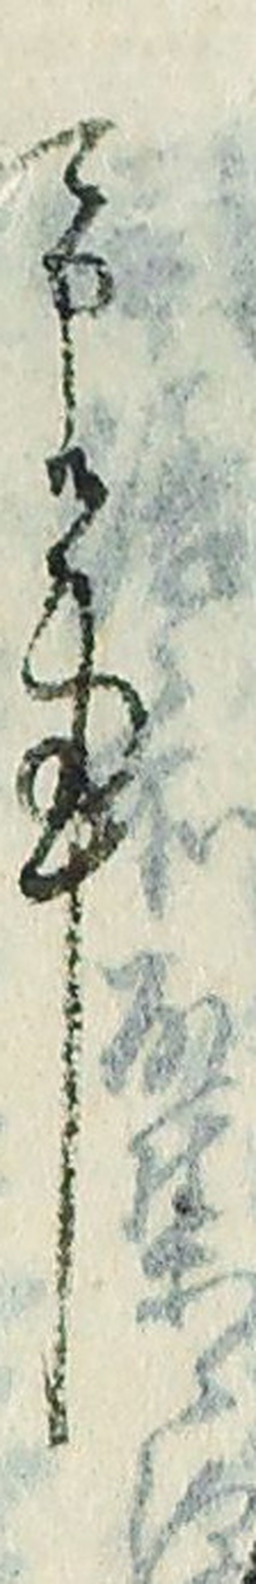可申候事
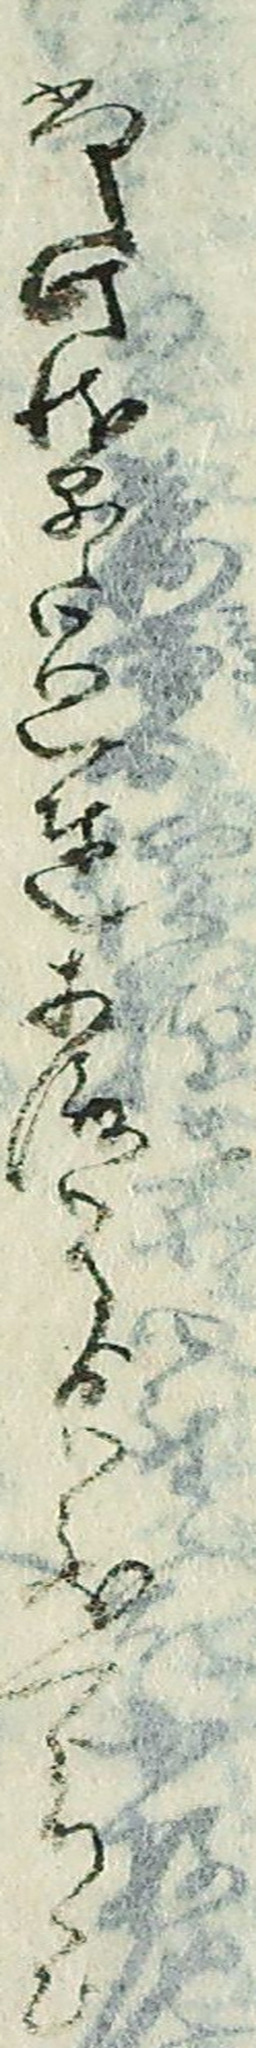尚此状早々御廻達相済候方ゟ御戻可被下候以上
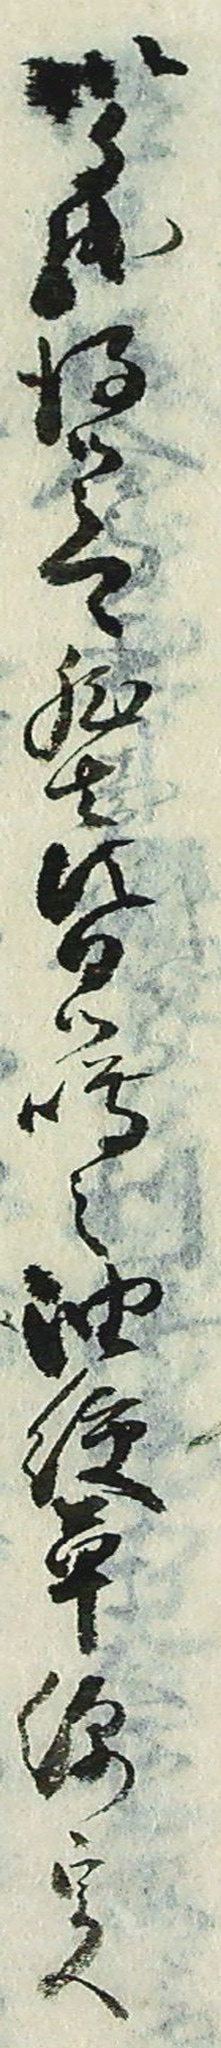以手紙得御意候然者頃日御噂之油絞草綿実
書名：油稼御取究ニ附御箇條書テ以被仰渡南北同役申談御答書控
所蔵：鳴門教育大学 Naruto University of Education
